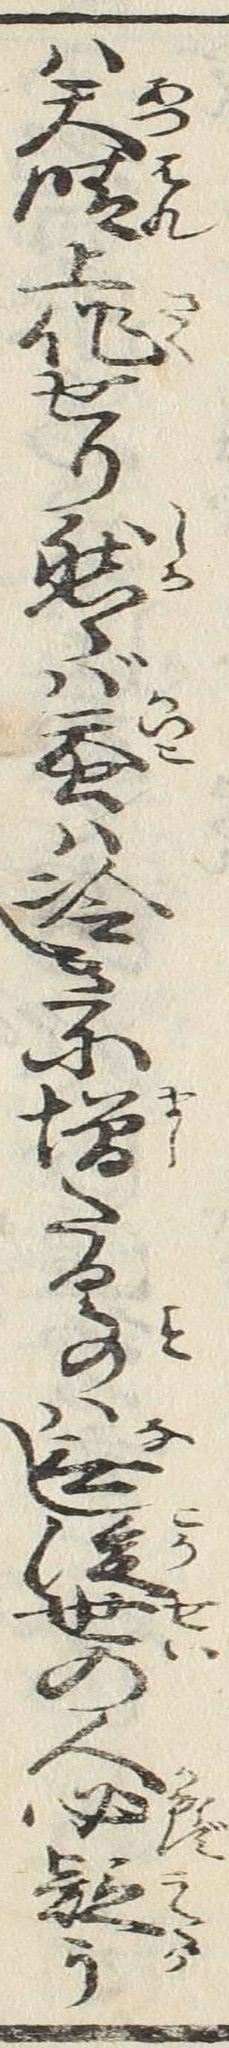は天晴上作せり然らば蚕は冷しきに増たる事は無し後世の人必疑う
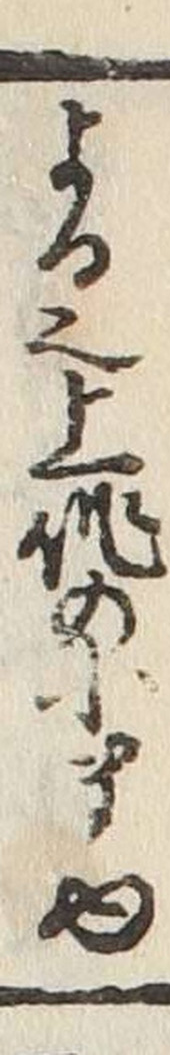よる也上作の小まゆ
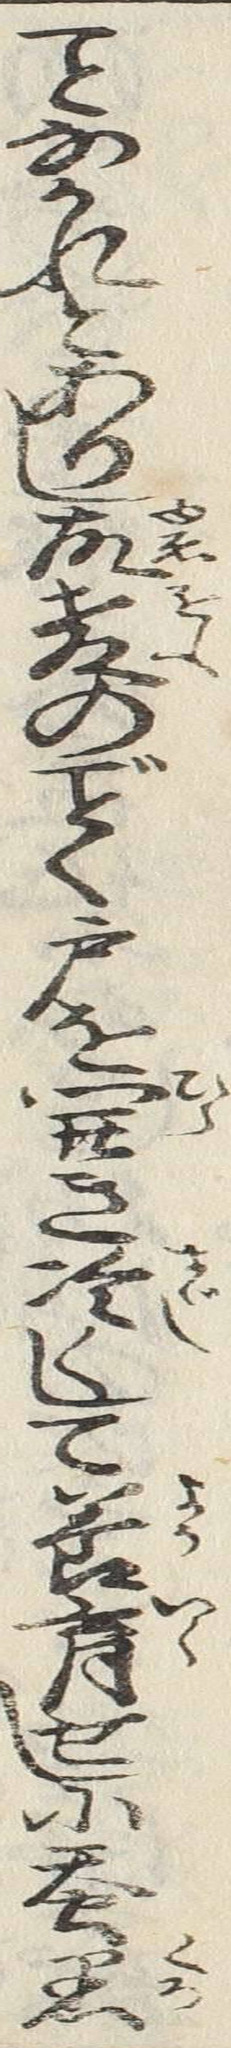ことなかれとありし故教のごとく戸を開き冷くして養育せしに蚕黒
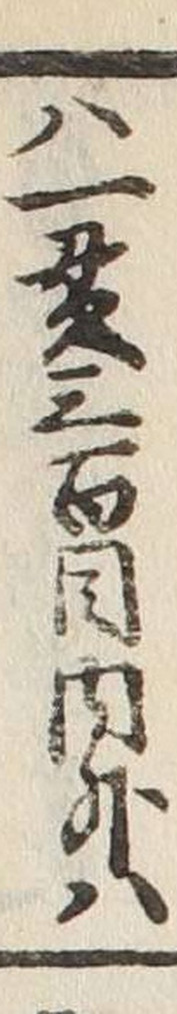は一貫三百目内外は
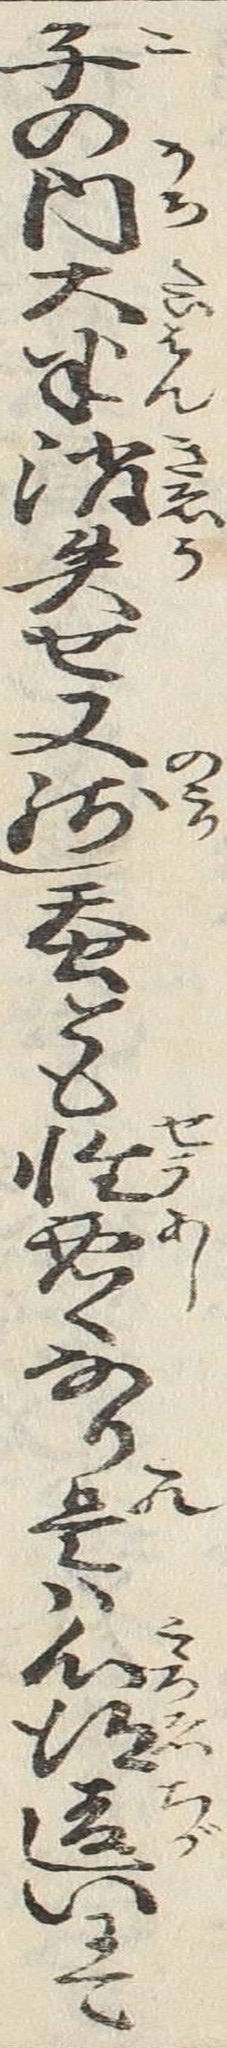子の内大半消失せ又残し蚕とも性悪くなり是は心得違いにて

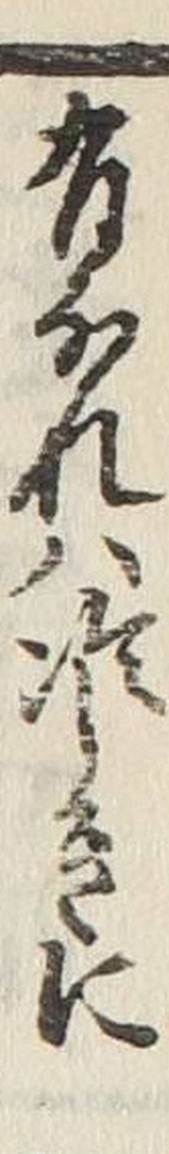有なれは冷しきに
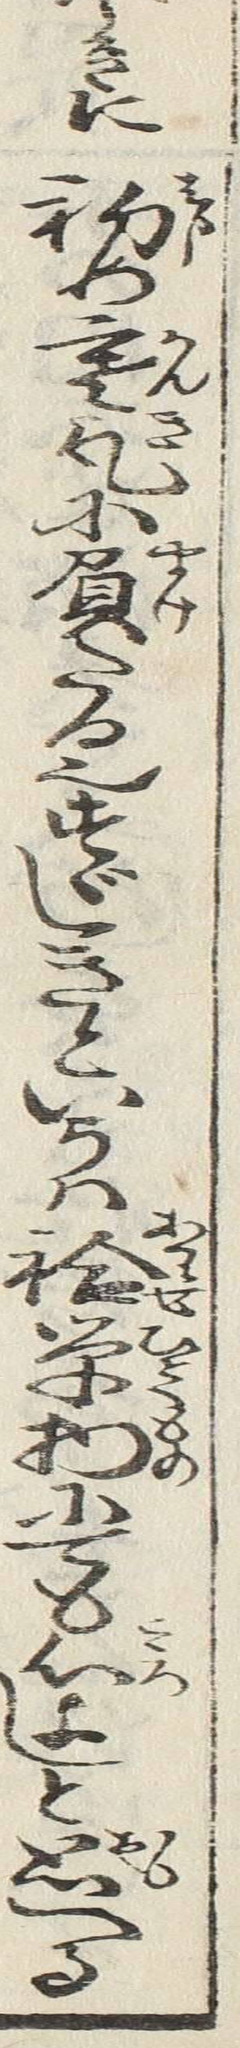初め寒気に負たる也すゞしきというは袷単物にても心よしと思へる
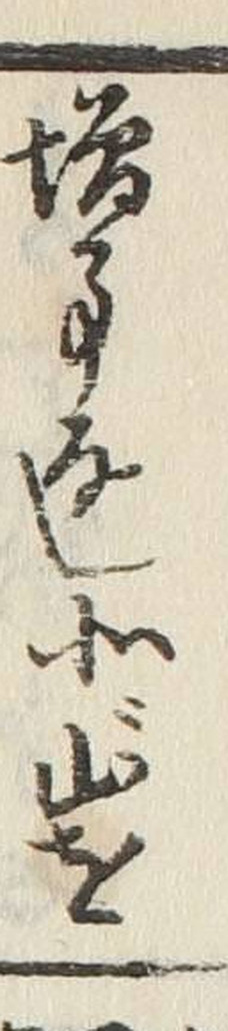増事なし北に山を
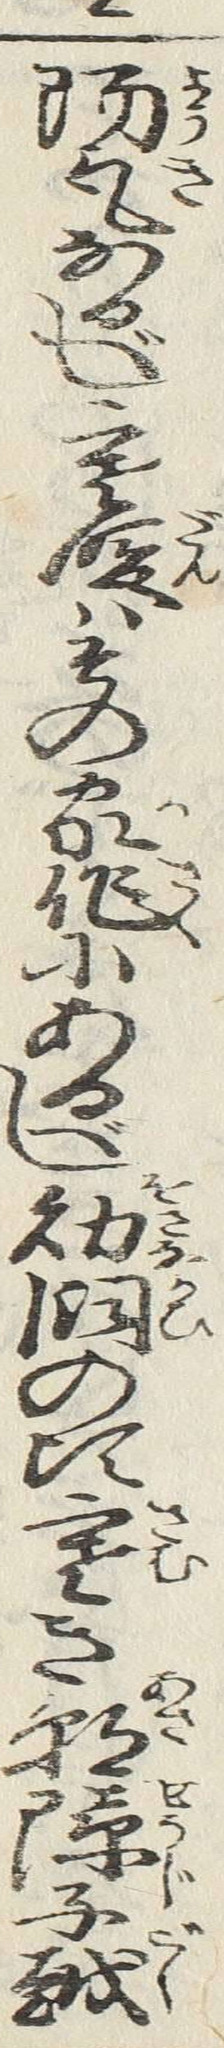陽気なるべし寒暖はその家作にあるべし幼飼の頃寒き朝障子越
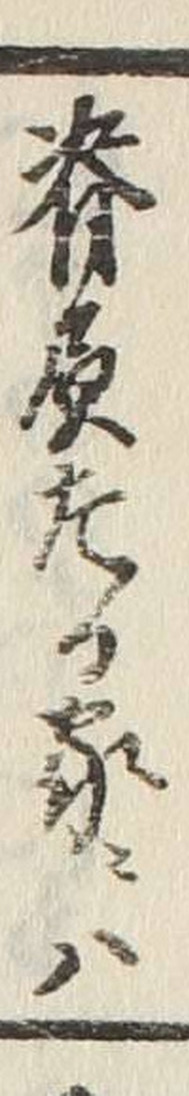脊負たる家には
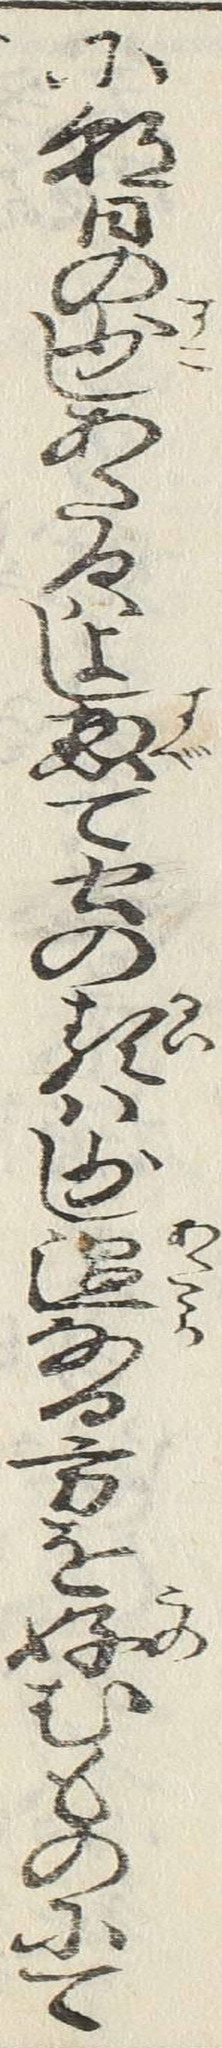に朝日の少しあたるはよし惣て虫の類は少し温なる方を好むものにて
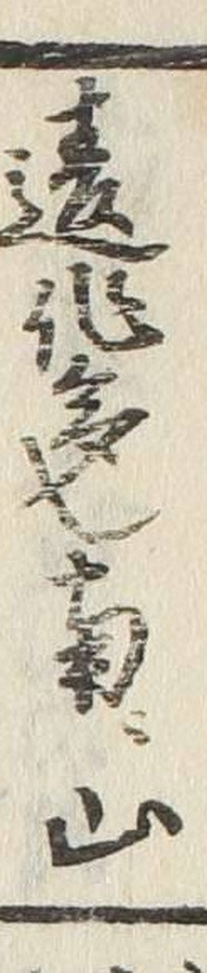違作多し南に山
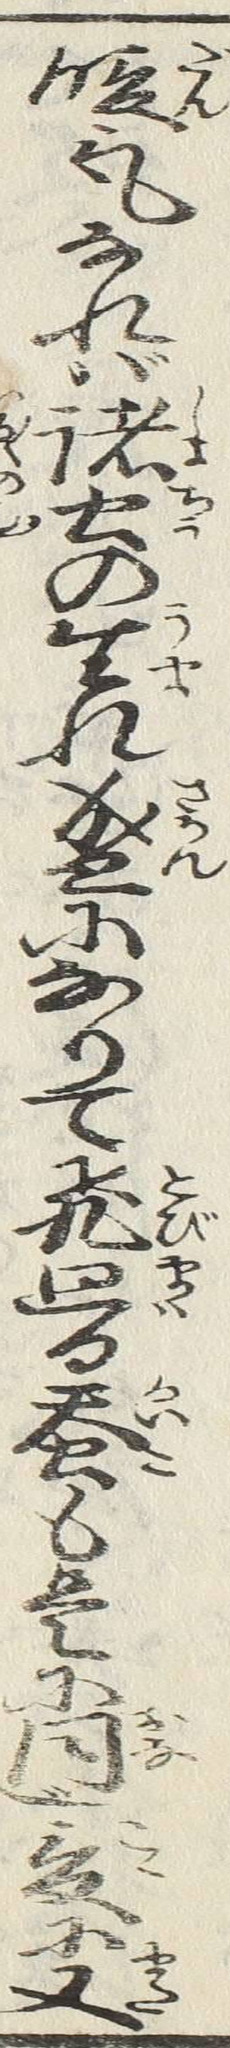暖気なれば諸虫の生れ盛になりて飛廻る蚕も是に同じ爰に又
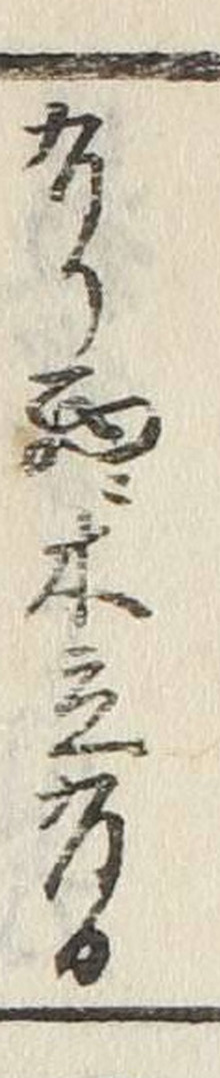有り西に木立有る
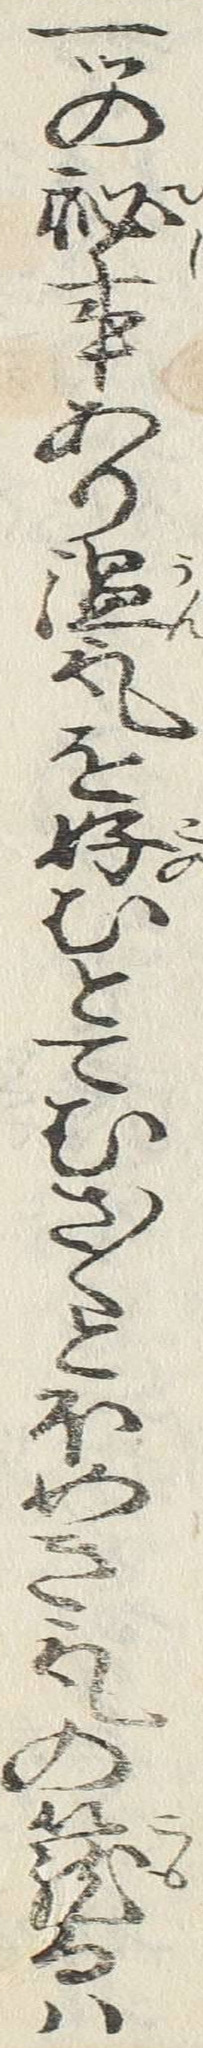一ッの秘事あり温気を好むとてむさ〳〵とほめき気の籠るは
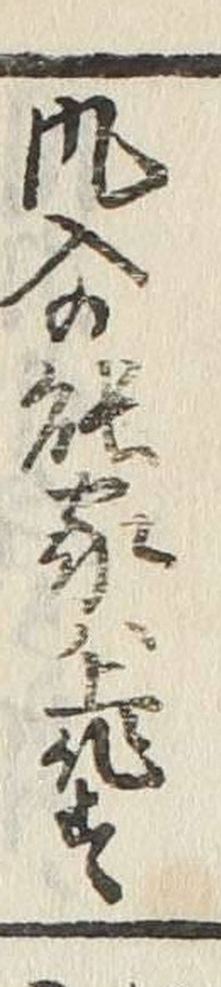風入の能家は上作す
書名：養蠶實驗録
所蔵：東京大学農学生命科学図書館 国文学研究資料館
